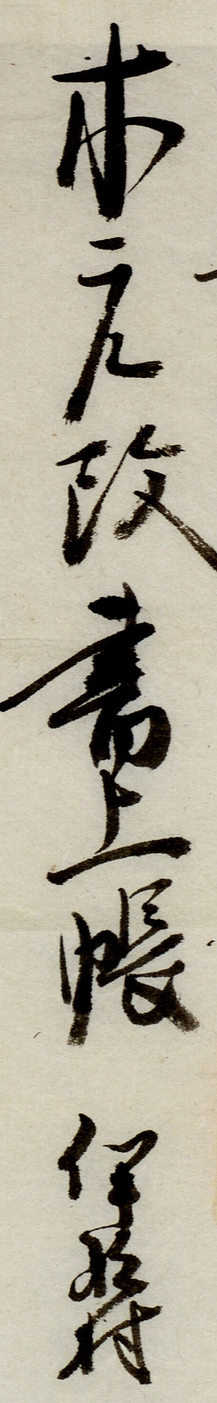木元改書上帳伊那村
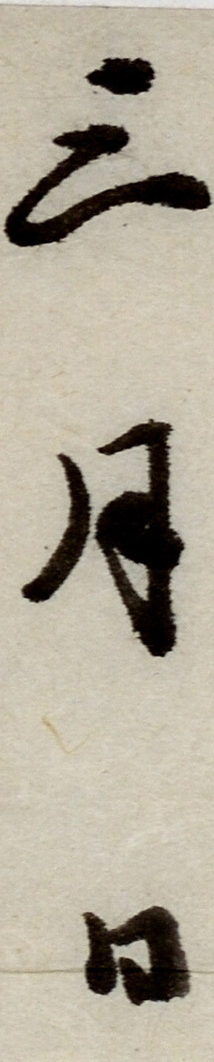三月日
